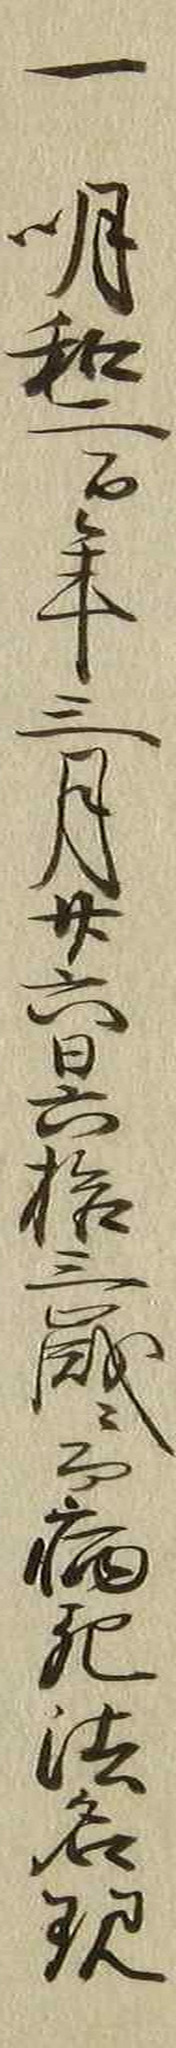一明和二酉年三月廿六日六拾三歳ニ而病死法名現
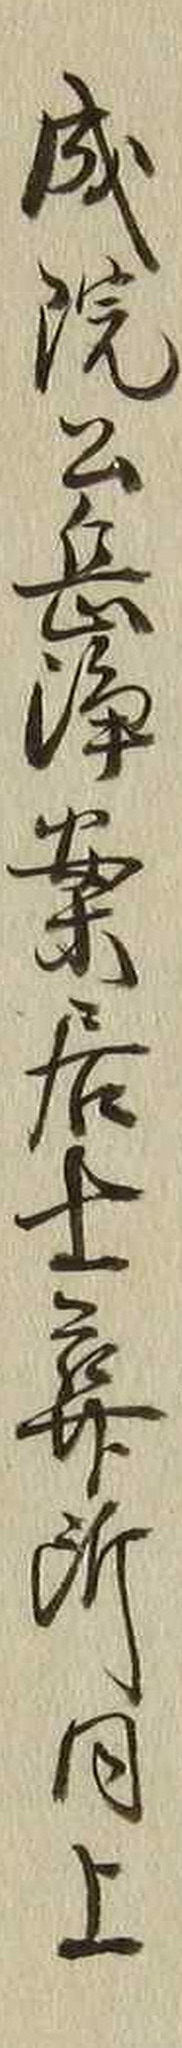成院公岳淨案居士葬所同上
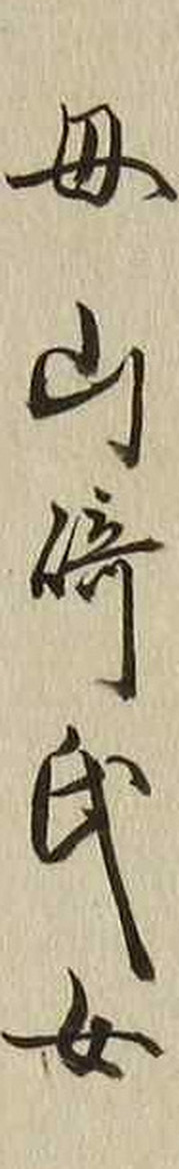母山崎氏女
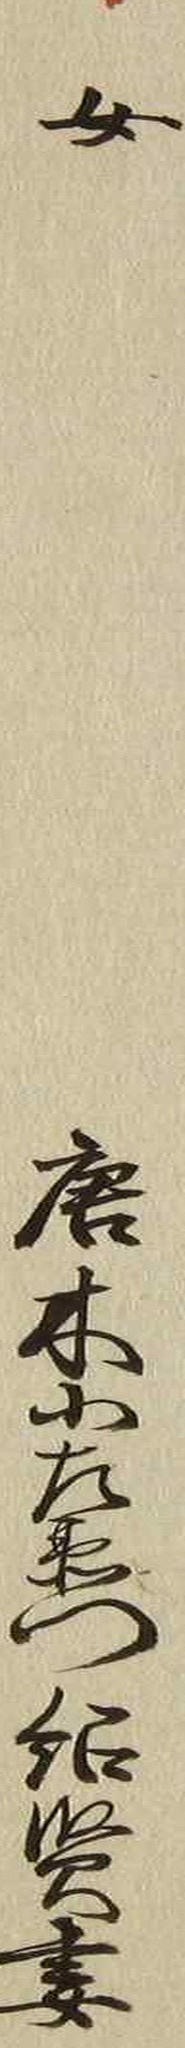女唐木小左衛門紹賢妻
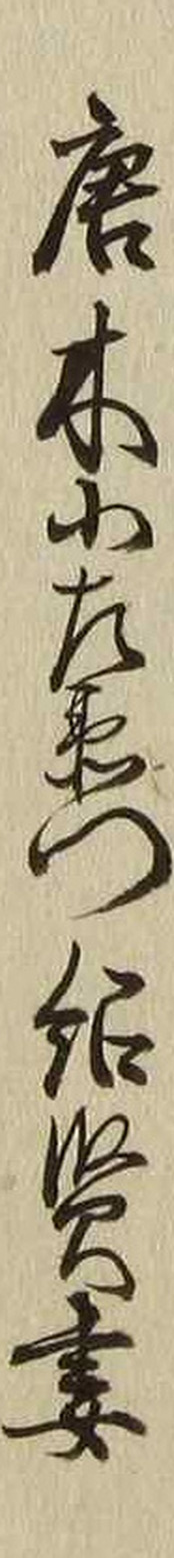女唐木小左衛門紹賢妻
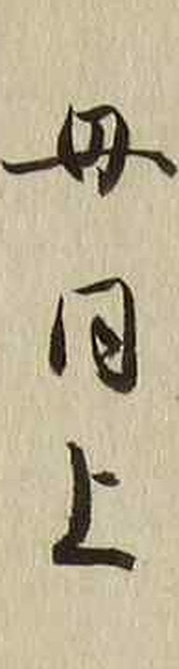母同上
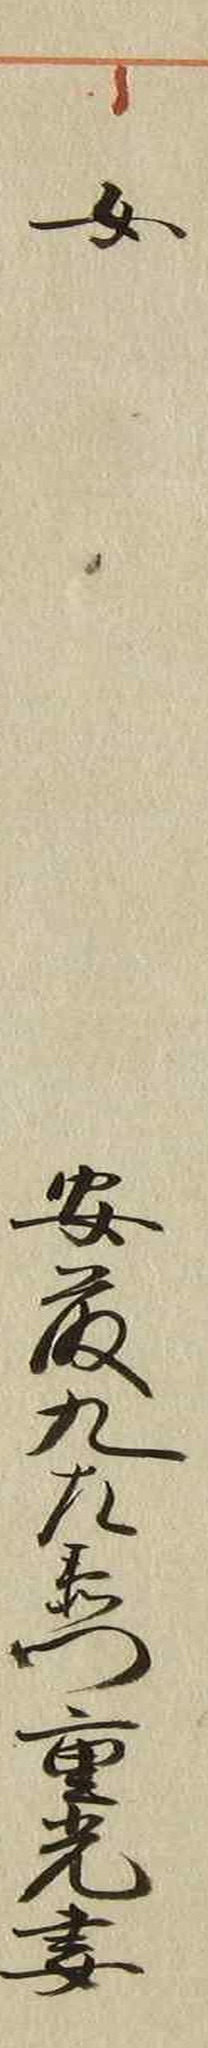女安藤九左衛門重光妻
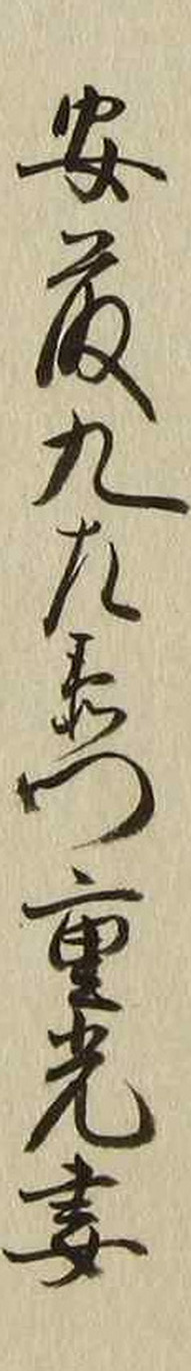女安藤九左衛門重光妻
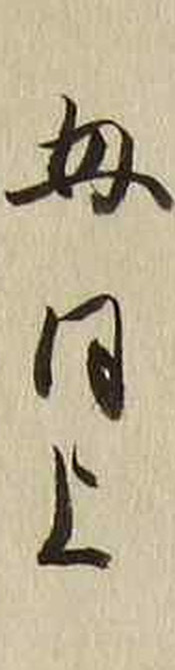母同上
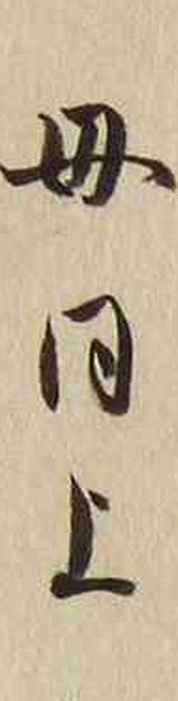母同上

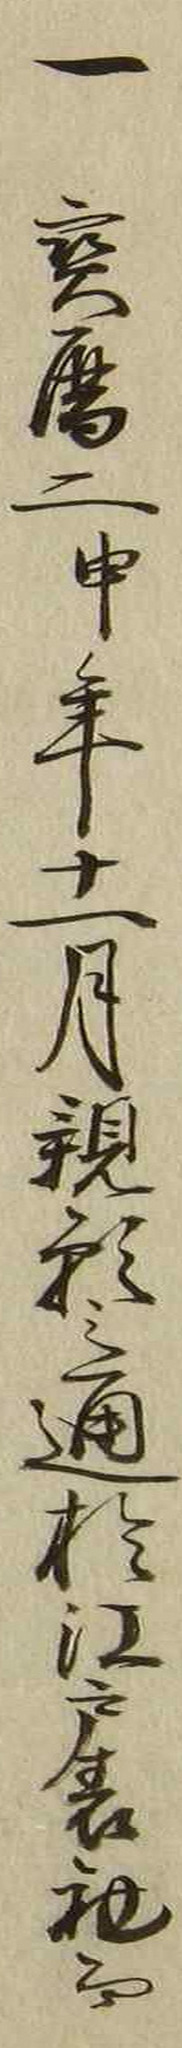一宝暦二申年十一月親願之通於江戸表初而
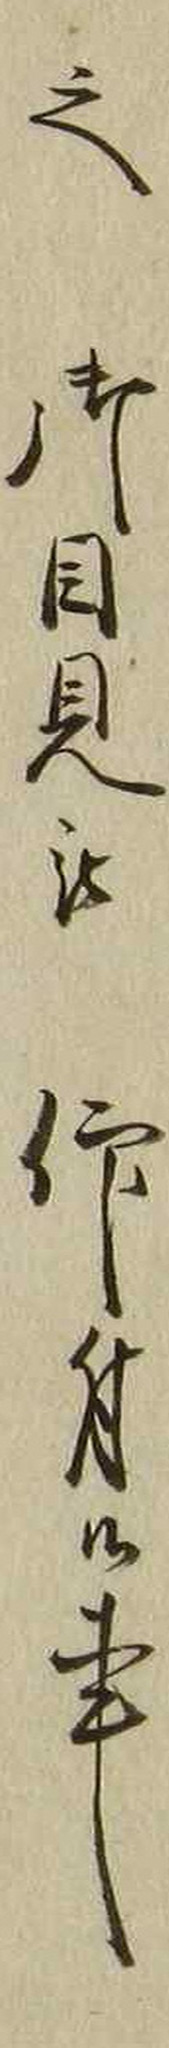之御目見被仰付候事
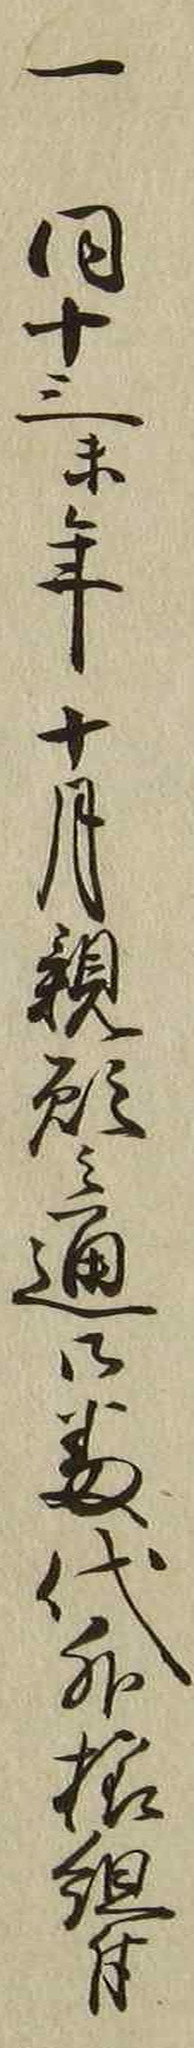一同十三未年十月親願之通御番代外様組付
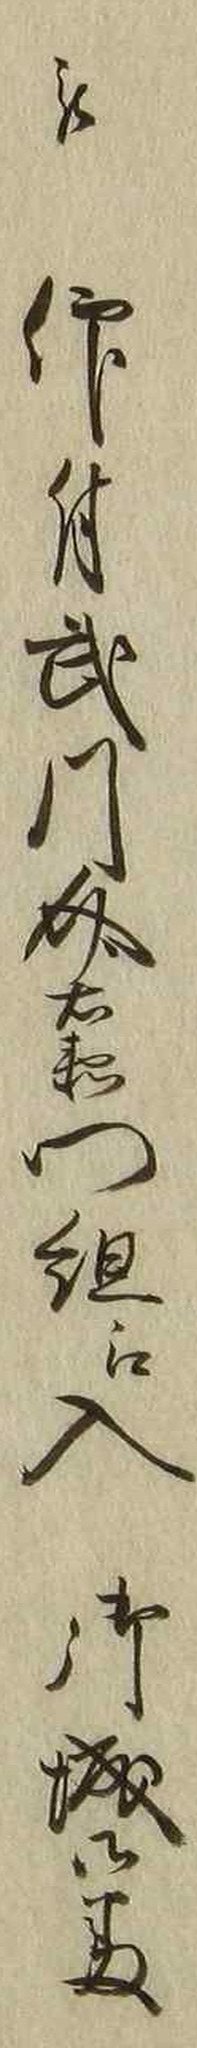被仰付武門介右衛門組江入御城御番
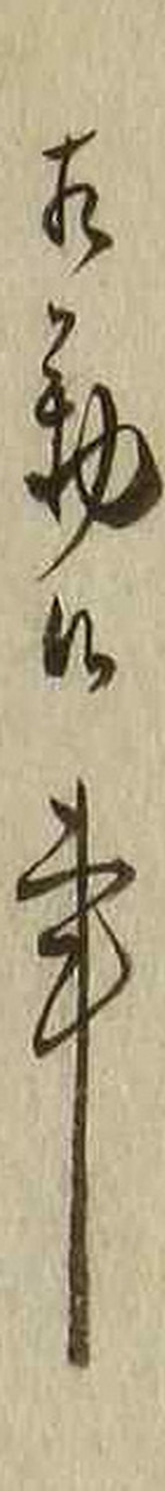相勤候事
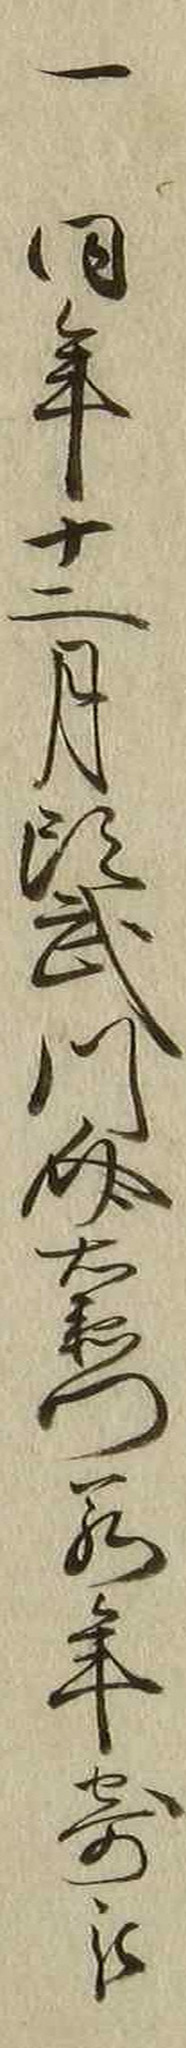一同年十二月頭武門介右衛門若年寄被
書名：諸士系譜　巻之65　ち之部1
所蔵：会津若松市立会津図書館
